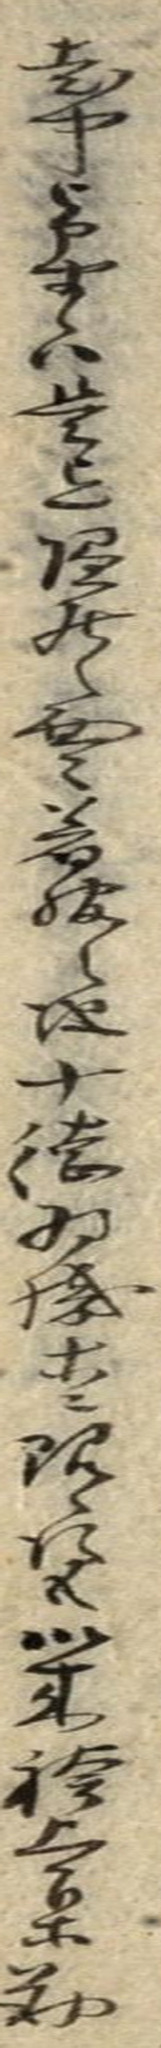老中被申聞候は是迄隠居之面々着服之儀十徳羽織等に限候得共以来袴上下等勤
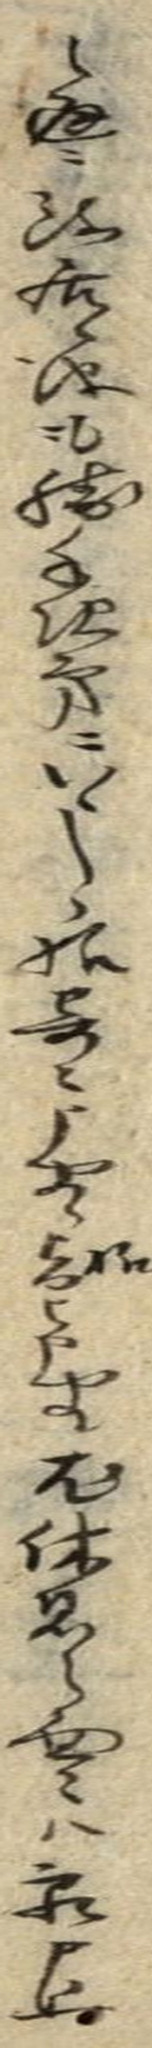之通に致居候儀も勝手次第にいたし候様寄々申聞候旨被申聞候尤休息之面々は願申上

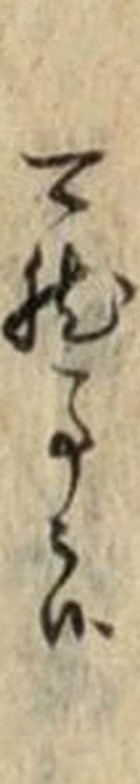可然事に候
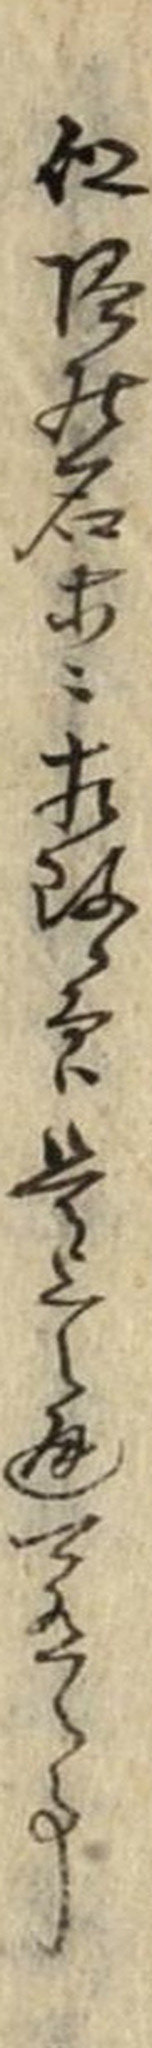但隠居名等に相改候而は是迄之通可有之事
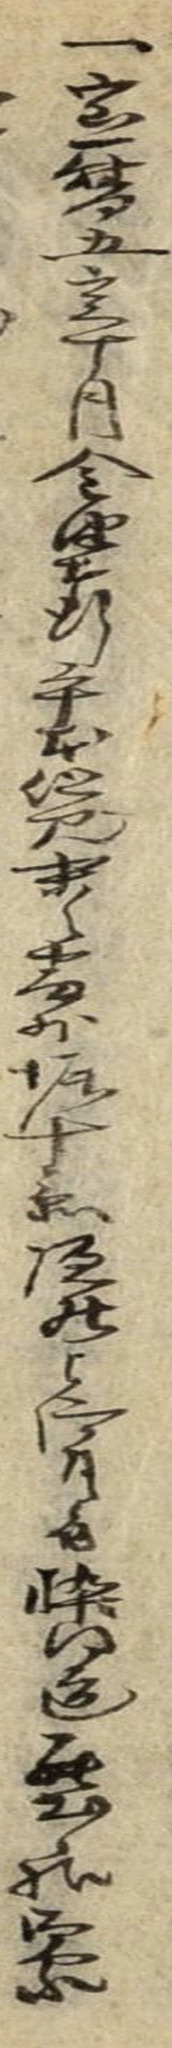一宝暦五亥十月金津奉行平本但見未之番外堀十兵衛隠居被仰付候に付忰同道罷出候様御家
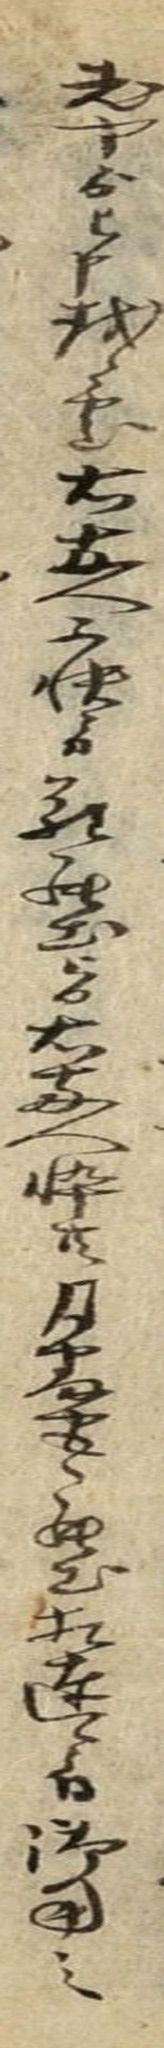老中ゟ被申越候処右両人不快に付難罷出旨右両人忰共月番宅へ罷出相達候に付御用之
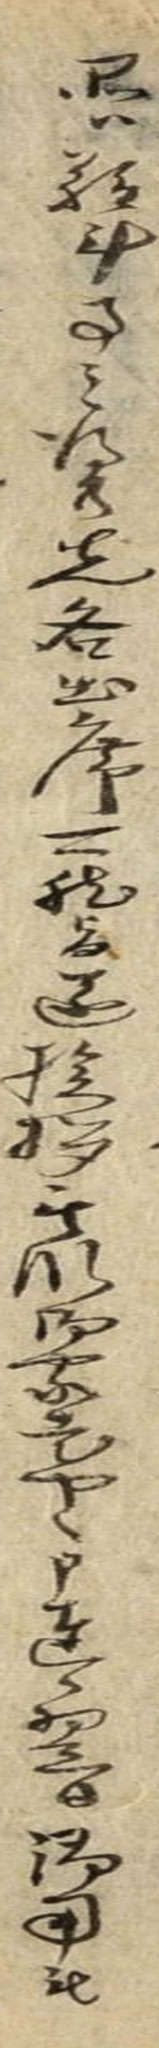品は難斗事に候得共先各出席可然旨遂挨拶其段御家老中へ申達候翌日御用被
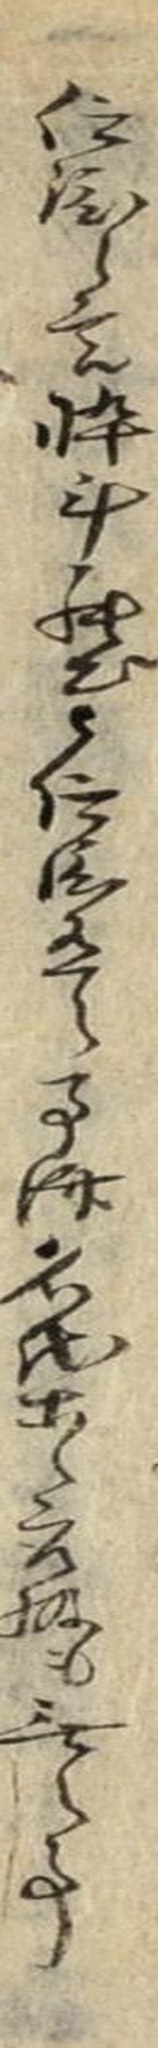仰渡之節忰斗罷出被仰渡有之事済名代等之取扱も無之事
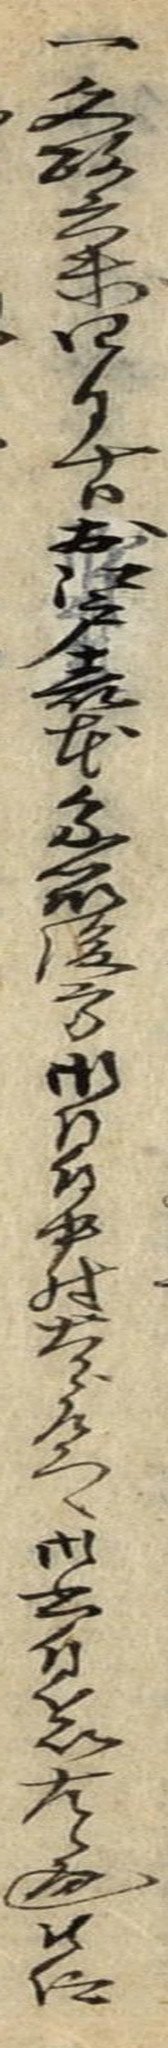一文政六未四月十日於江戸表本多筑後方御目付中村太郎左衛門へ御書付を以左之通被仰
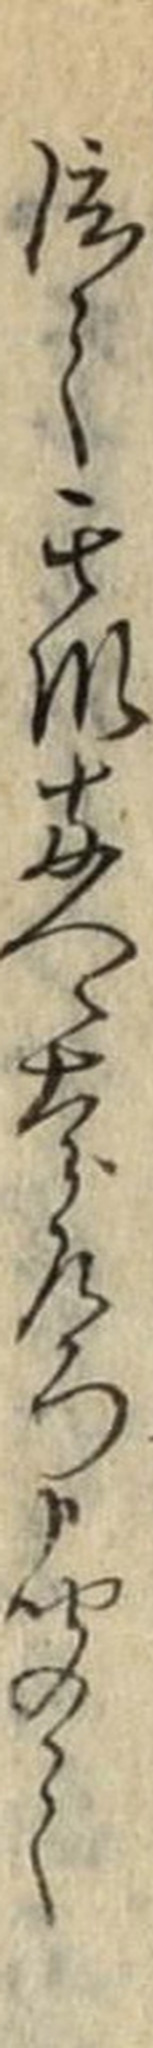渡之其段両人へ太郎左衛門申聞之
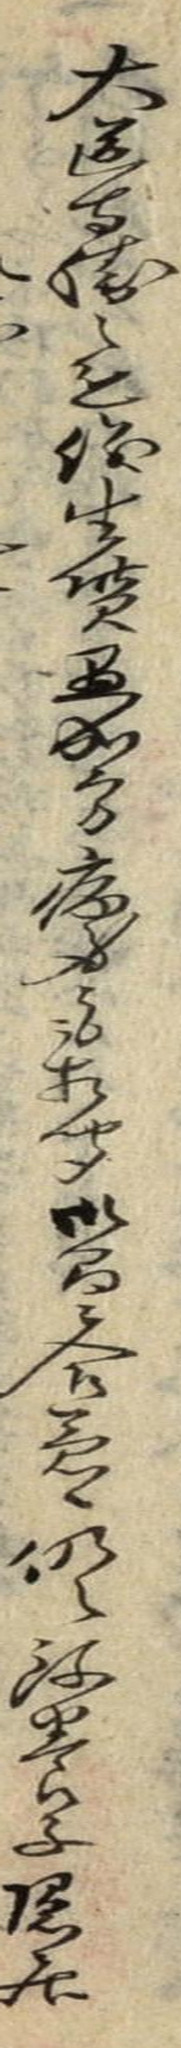大道寺勝之進儀生質愚成方病身にも相聞御間に合兼候仍之致養子隠居
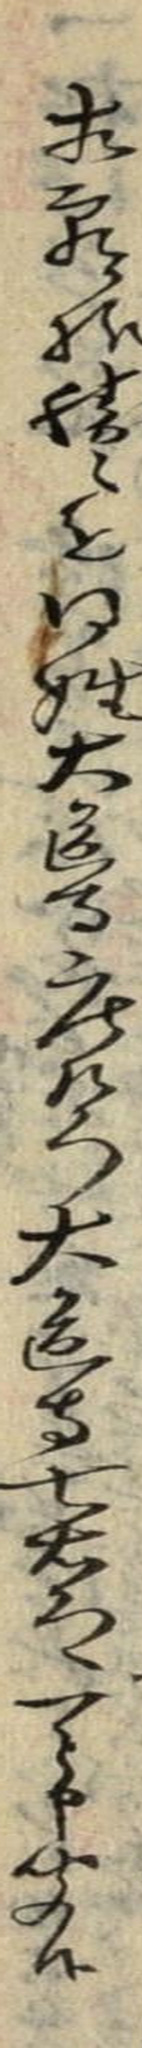相願候様勝之進同姓大道寺庄左衛門大道寺七右衛門へ可被申聞候
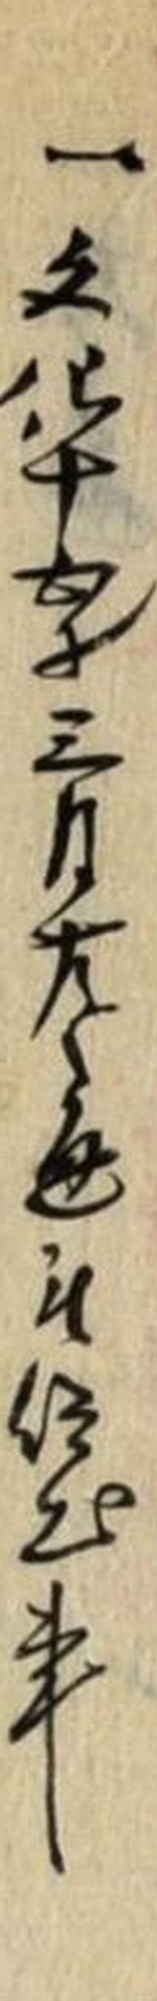一文化十五寅三月左之通被仰出事
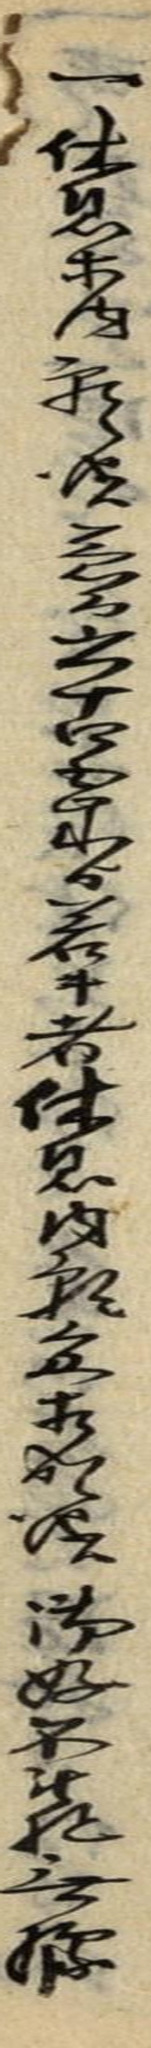一休息等内願之儀は兼而六十四五歳ゟ若き者休息内願多相成候儀は御好不被遊無拠
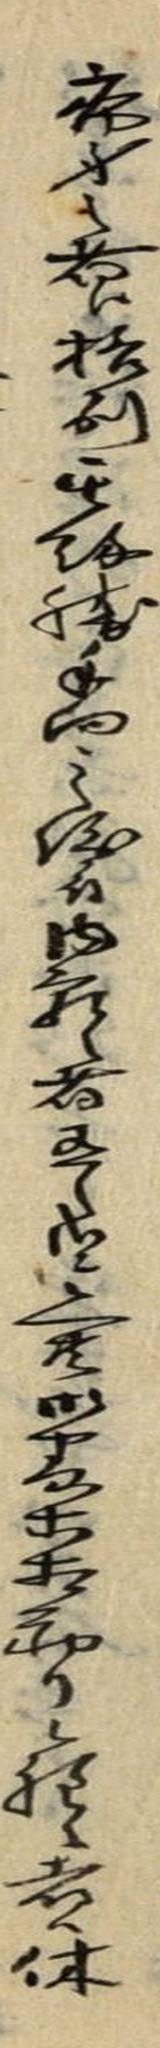病身之者は格別其餘勝手向之儀に付内願之者有之哉に候へ共御番等相勤り候程之者は休
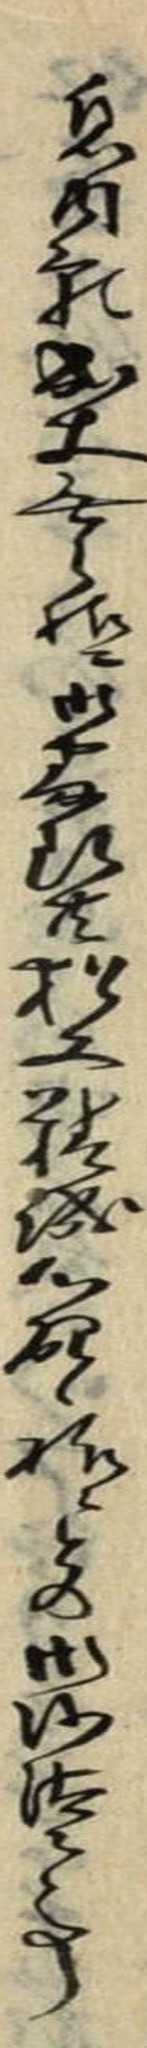息内願成丈無之様に御番頭共猶又精誠心配候様にとの御沙汰に候事
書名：御用并被仰出之部
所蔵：福井県文書館 Fukui Prefectural Archives
